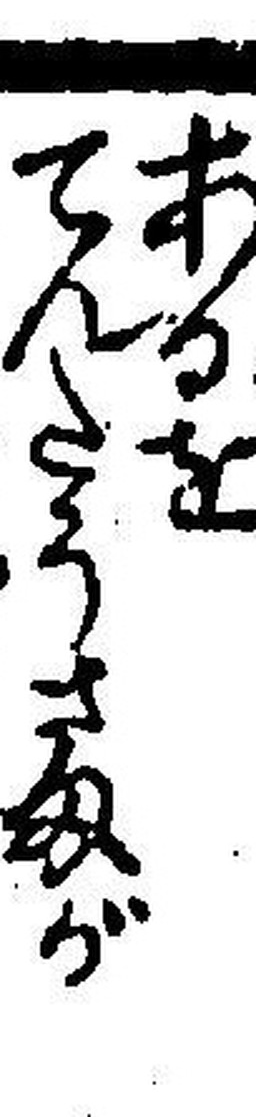てんとうさまが
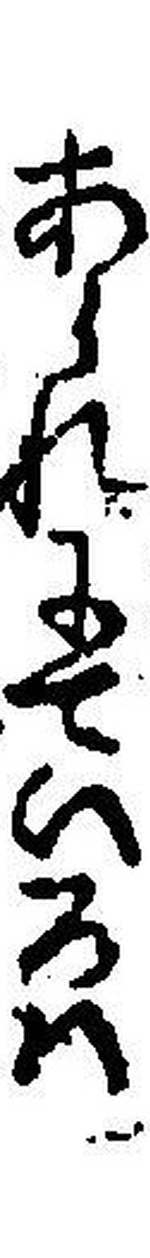あられにていろは
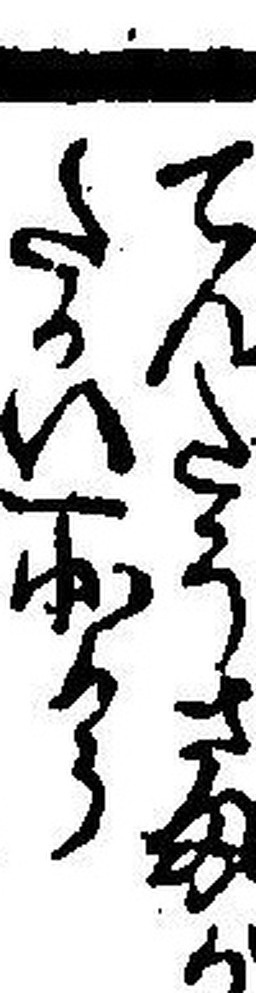たかい所から
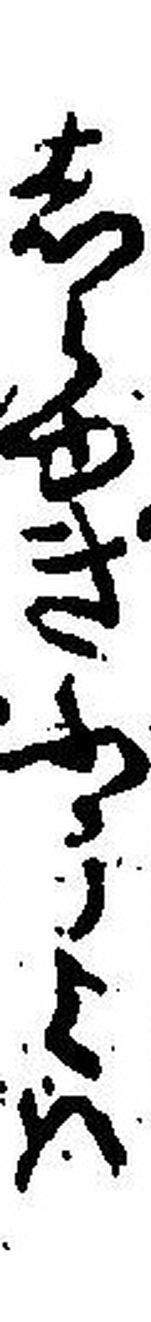しらゆきふうみは
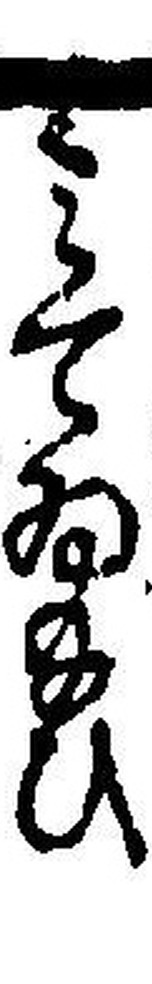みてゐ給ひ
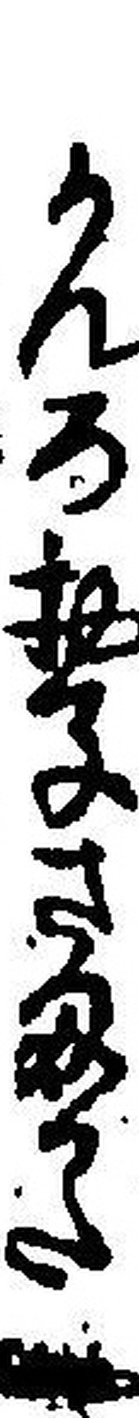かんろお子さまかた
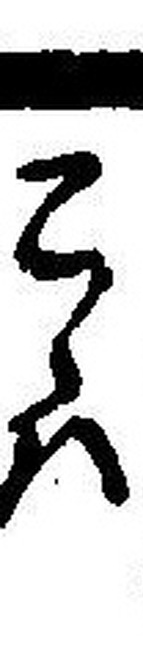こゝは
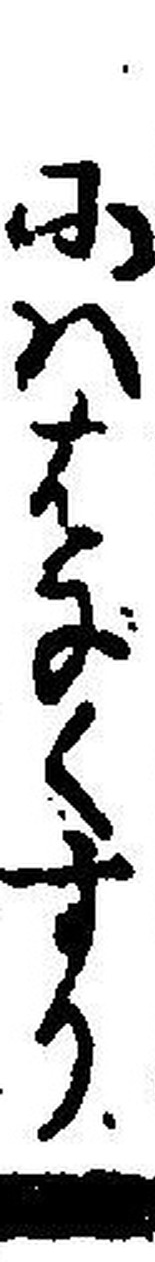にははなくすり
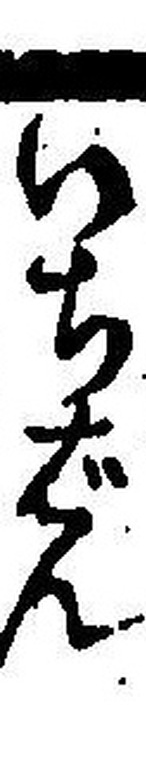いちばん
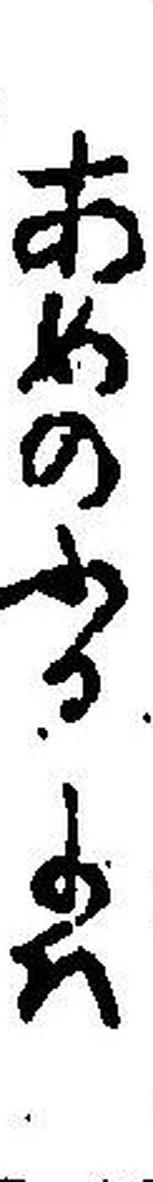あめのふるよは
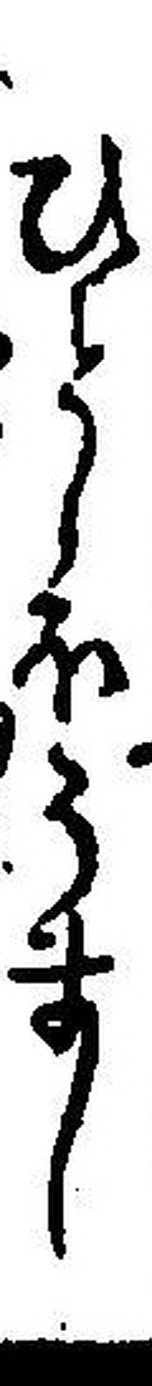ひとしほうまし
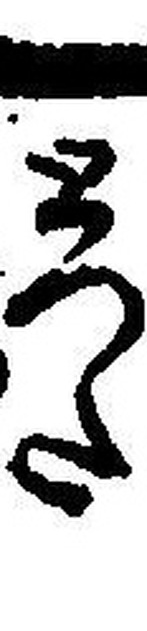とつた
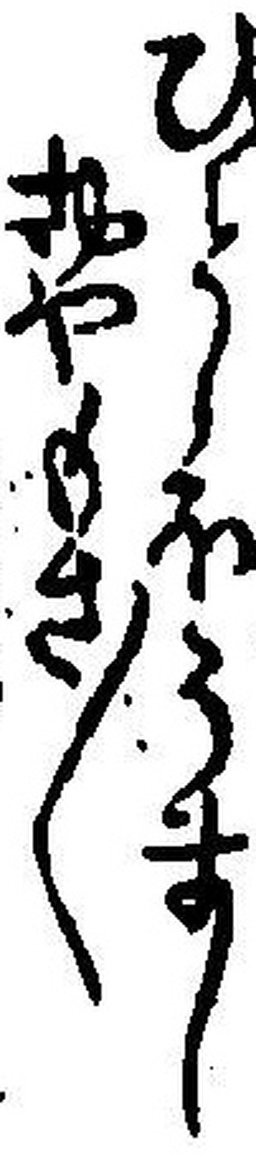おやもさ〳〵
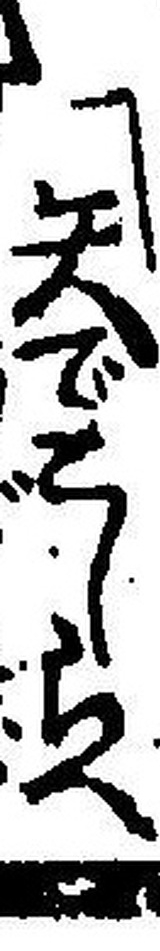〽天でこしらへ
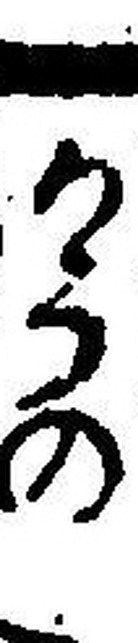かうの
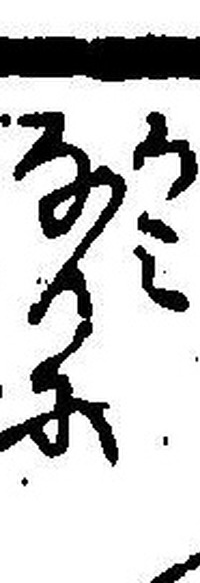なりに
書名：徳若水縁起金性 / 樹下石上作
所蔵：東京大学総合図書館 General Library in the University of Tokyo, JAPAN
